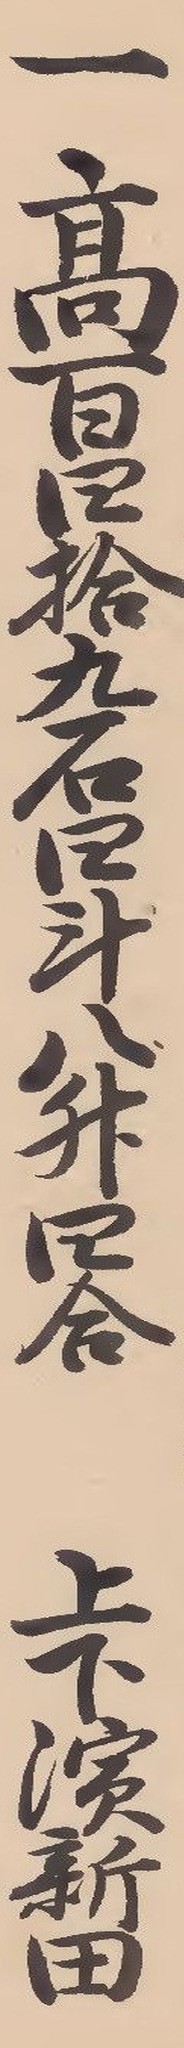一高百四拾九石四斗八升四合上下浜新田
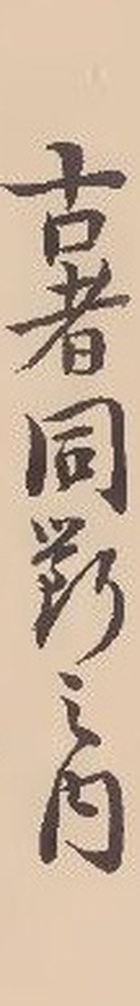古者同断之内
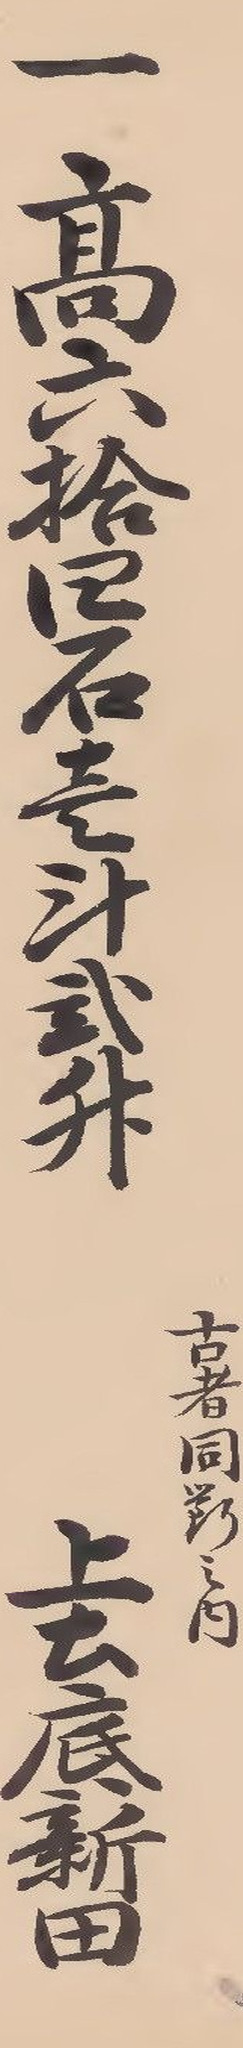一高六拾四石壱斗弐升上土底新田
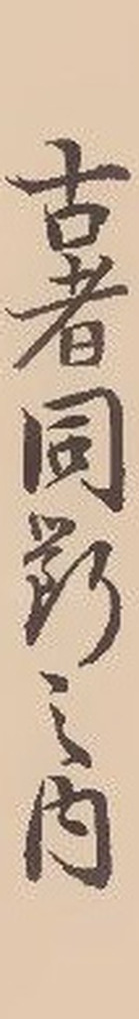古者同断之内
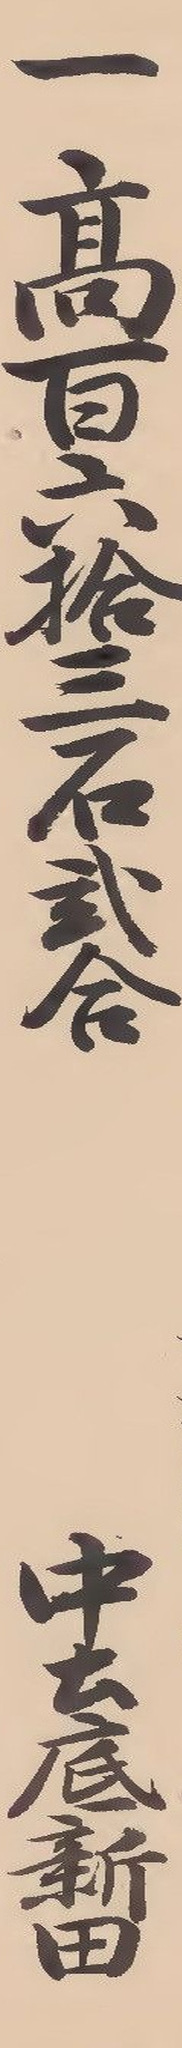一高百六拾三石弐合中土底新田
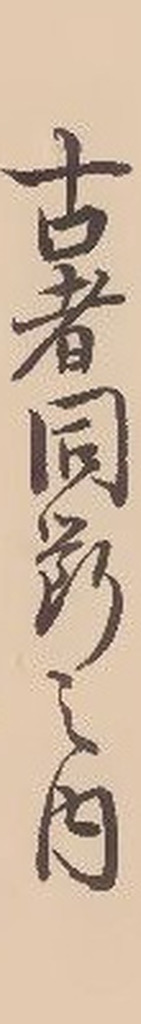古者同断之内
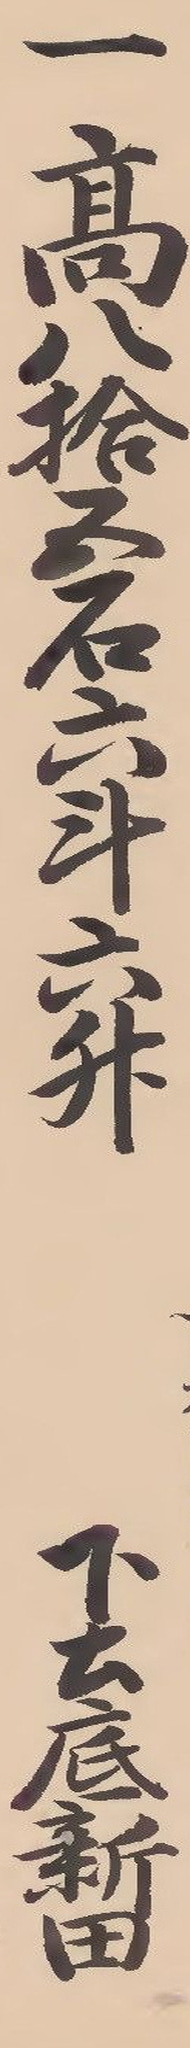一高八拾五石六斗六升下土底新田
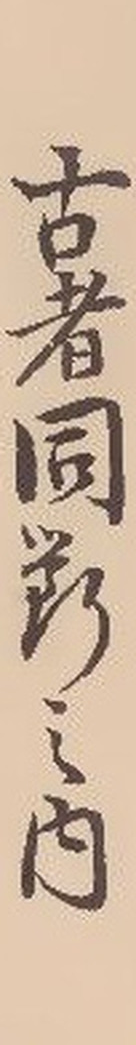古者同断之内
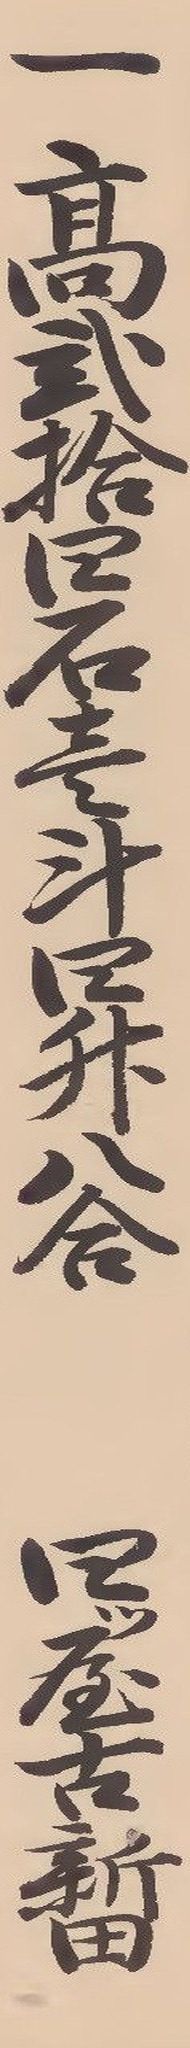一高弐拾四石壱斗四升八合四ツ屋古新田
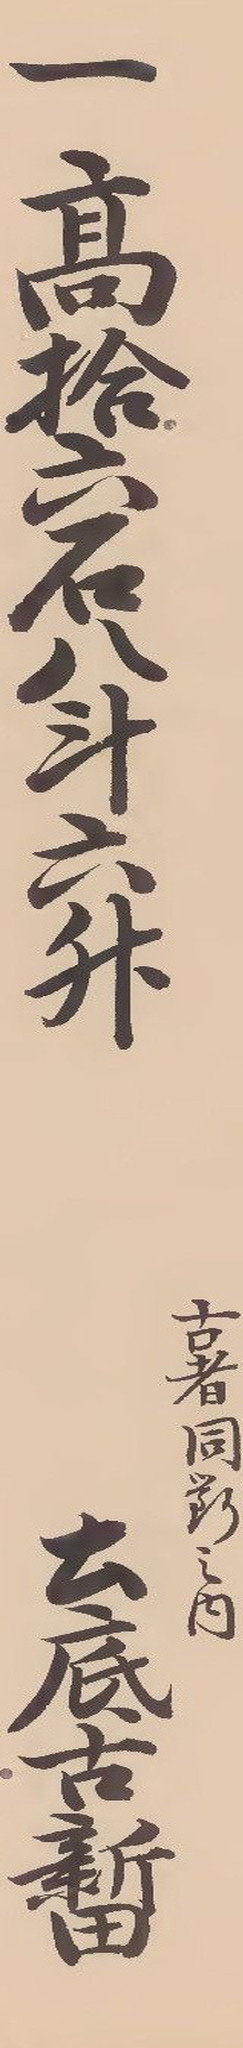一高拾六石八斗六升土底古新田
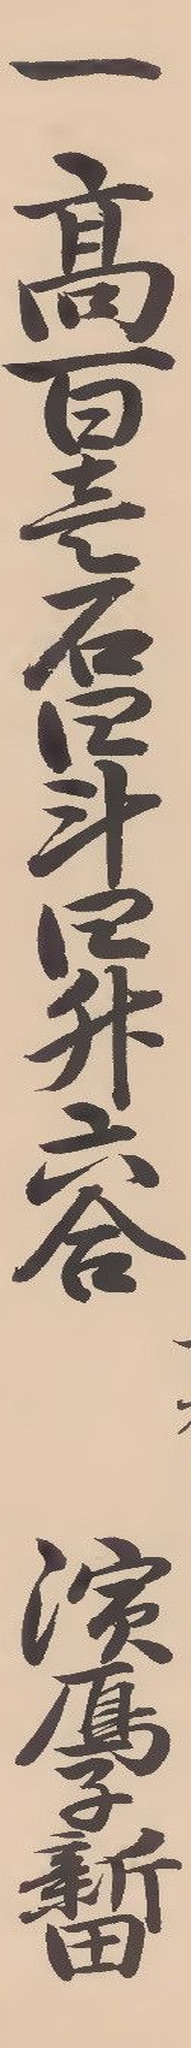一高百壱石四斗四升六合浜雁子新田
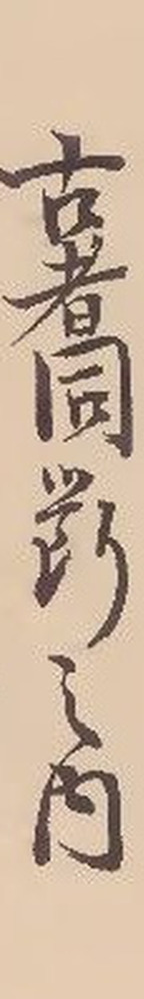古者同断之内

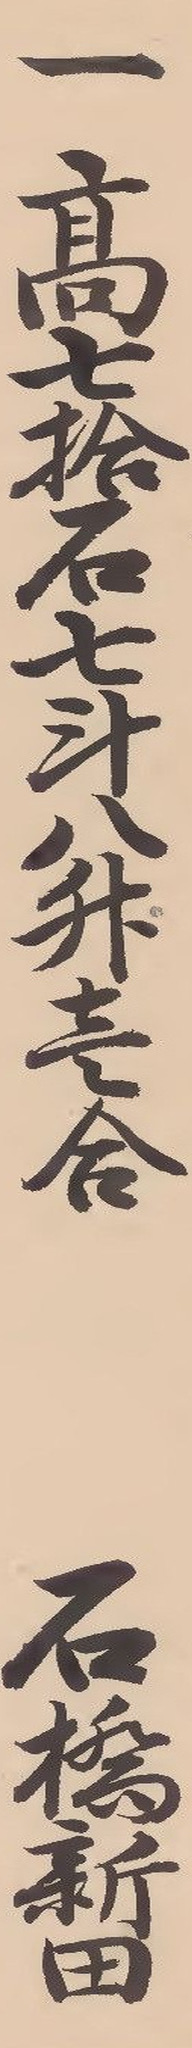一高七拾石七斗八升壱合石橋新田
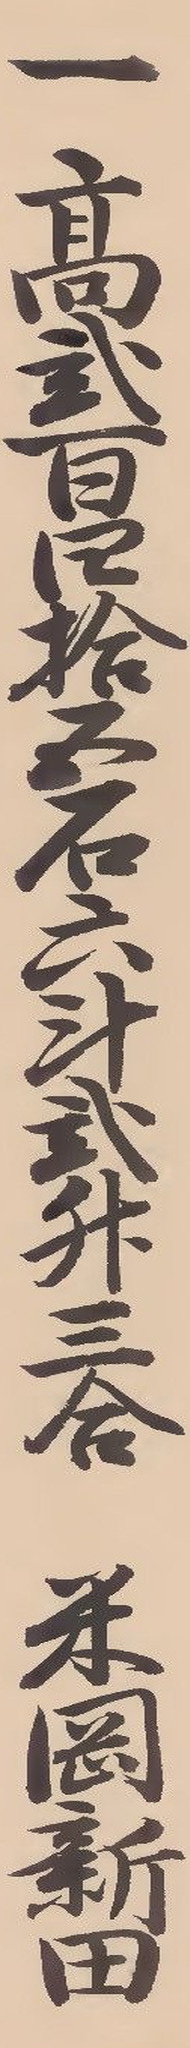一高弐百四拾五石六斗弐升三合米岡新田
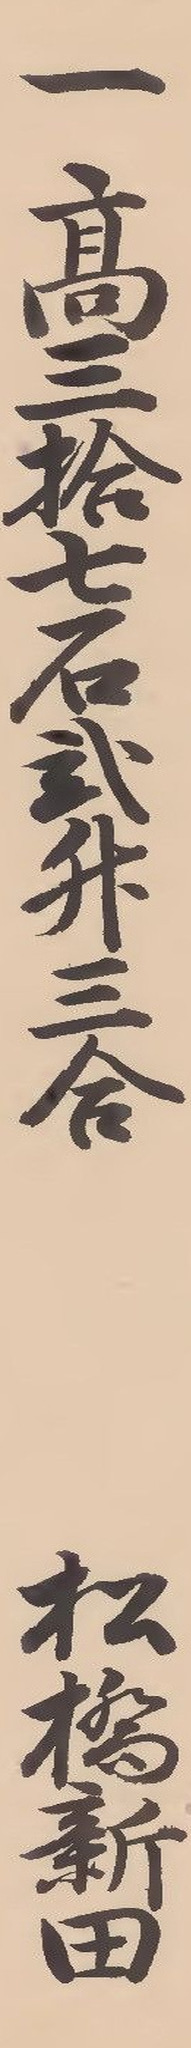一高三拾七石弐升三合松橋新田
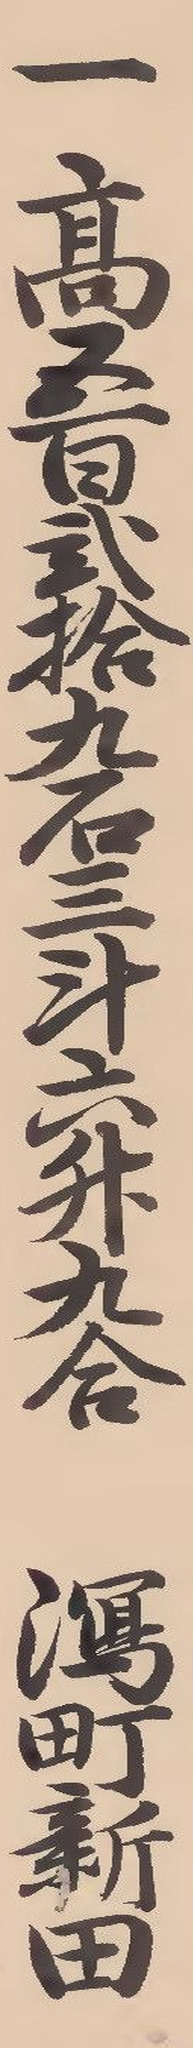一高五百弐拾九石三斗六升九合潟町新田
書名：越後国郷帳　上
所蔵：国立公文書館 National Archives of Japan
